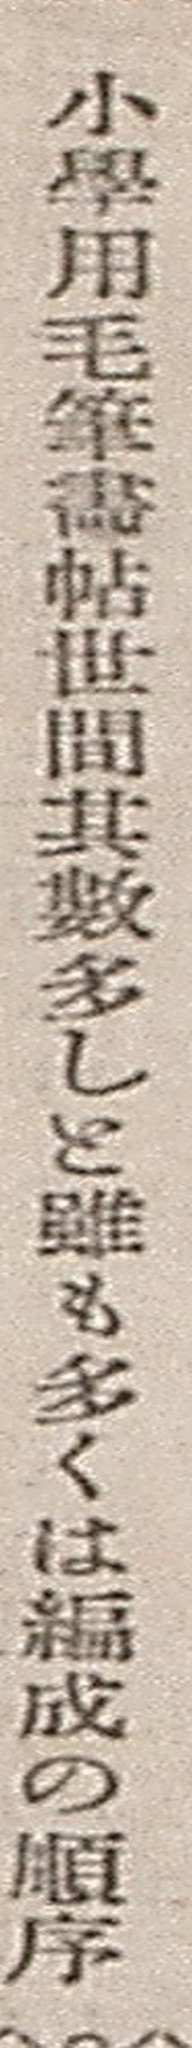小学用毛筆画帖世間其数多しと雖も多くは編成の順序
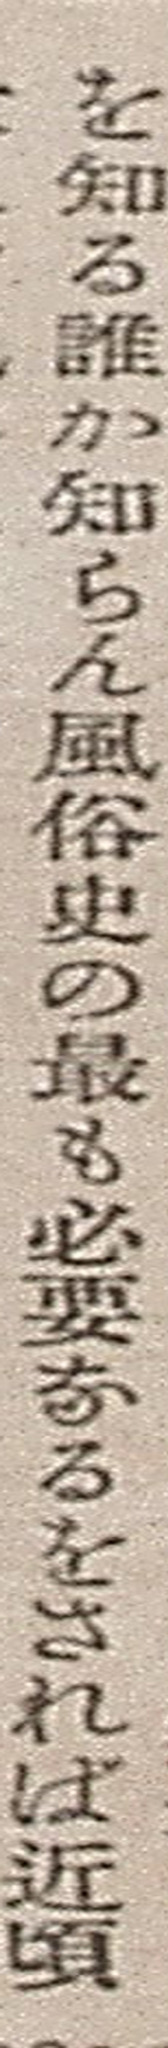を知る誰か知らん風俗史の最も必要なるをされば近頃
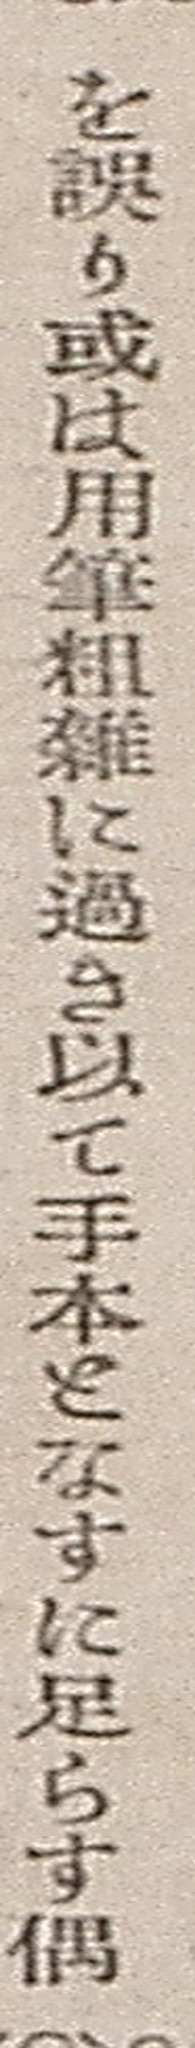を誤り或は用筆粗雑に過き以て手本となすに足らす偶
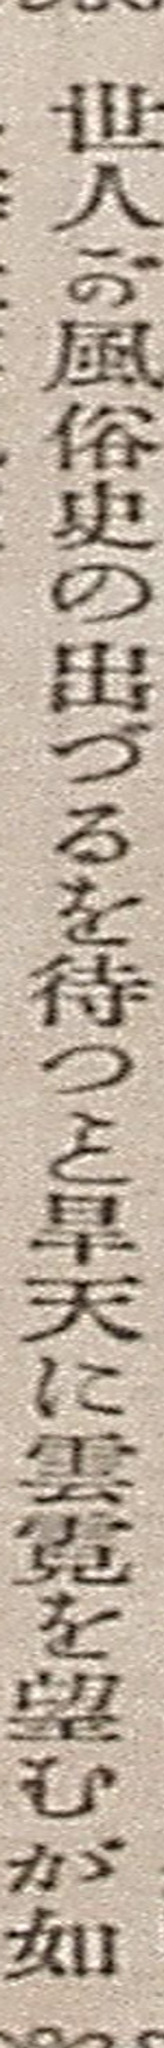世人が風俗史の出づるを待つこと旱天に雲霓を望むが如
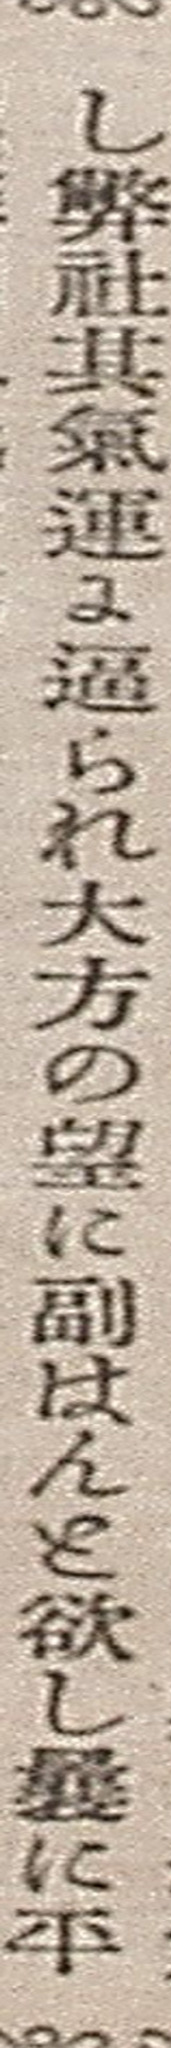し弊社其気運に逼られ大方の望に副はんと欲し曩に平
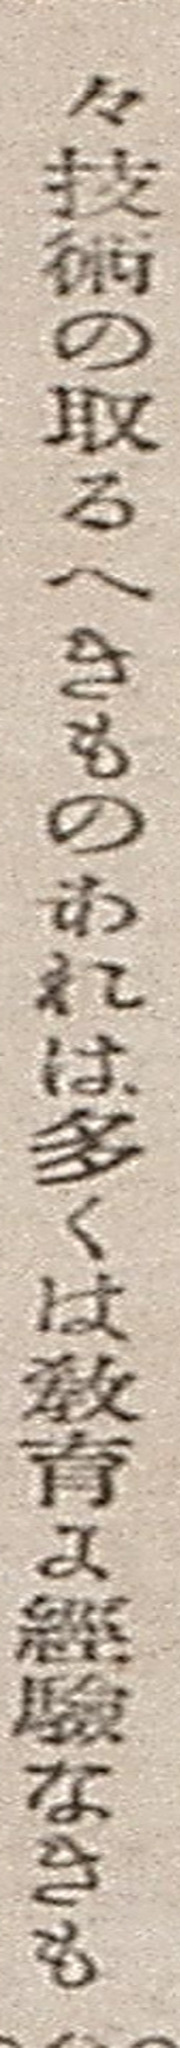々技術の取るへきものあれは多くは教育に経験なきも
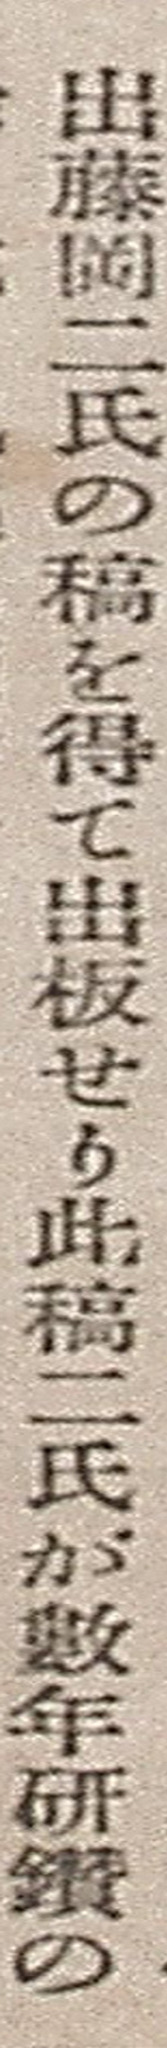出藤岡二氏の稿を得て出板せり此稿二氏が数年研鑽の
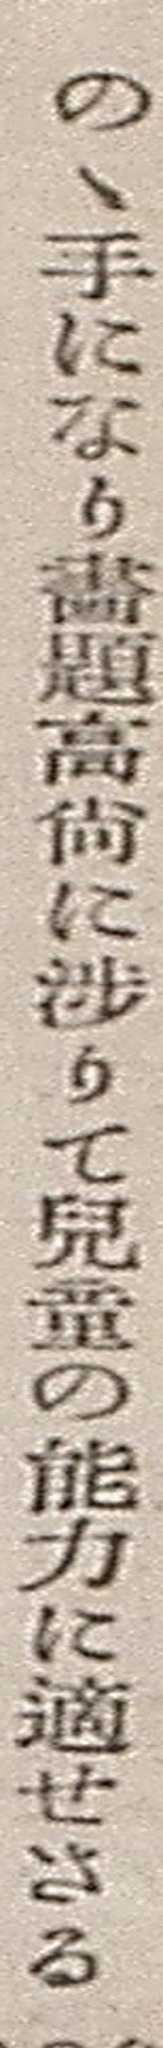のゝ手になり画題高尚に渉りて児童の能力に適せさる
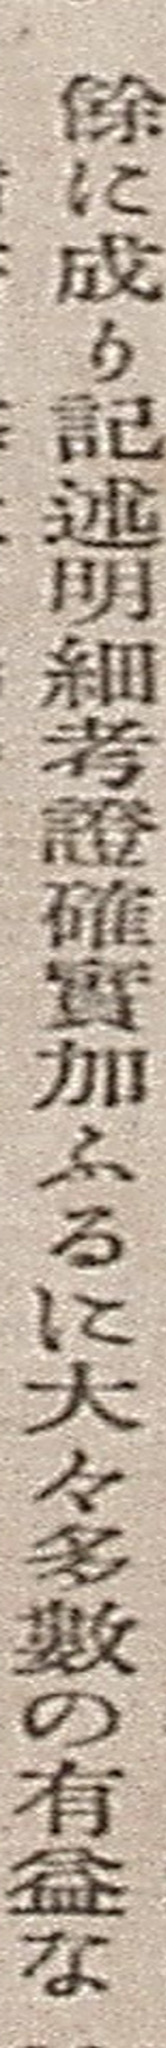余に成り記述明細考證確実加ふるに大々多数の有益な
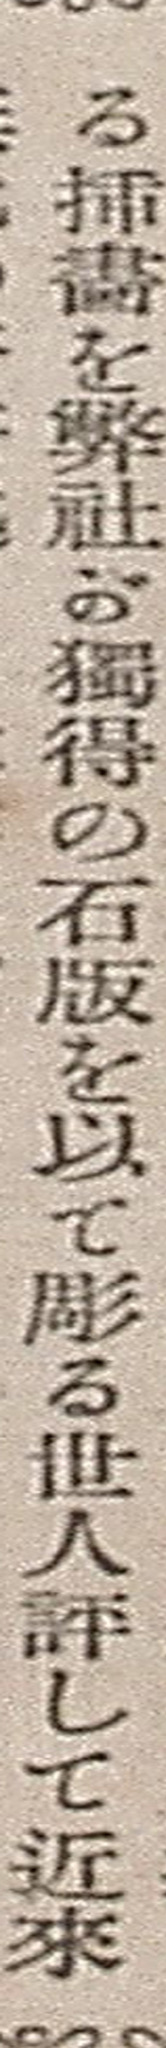る挿画を弊社が独特の石版を以て彫る世人評して近来
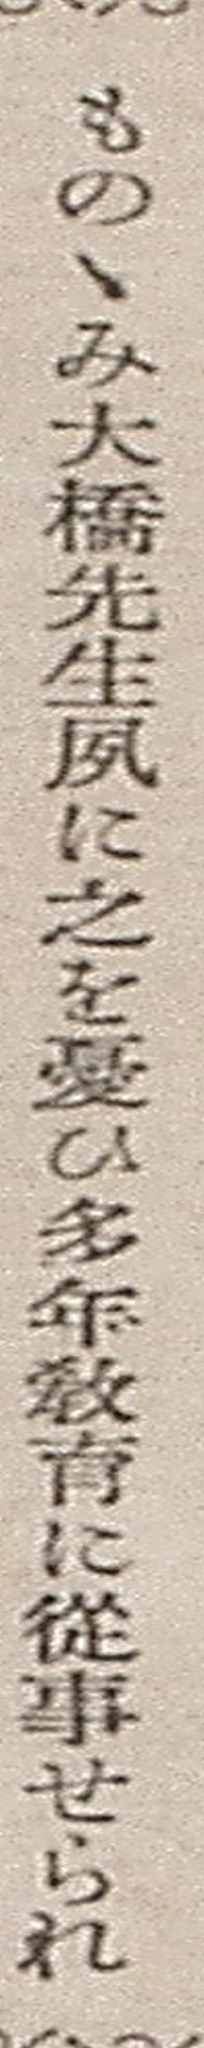ものゝみ大橋先生夙に之を憂ひ多年教育に従事せられ
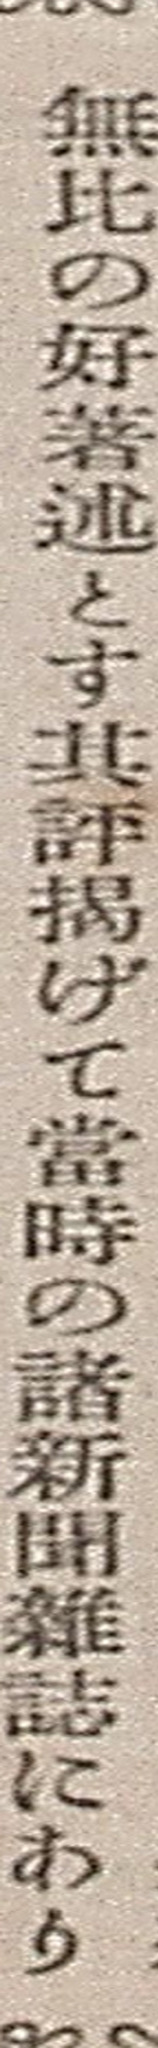無比の好著述とす其評揚げて当時の諸新聞雑誌にあり
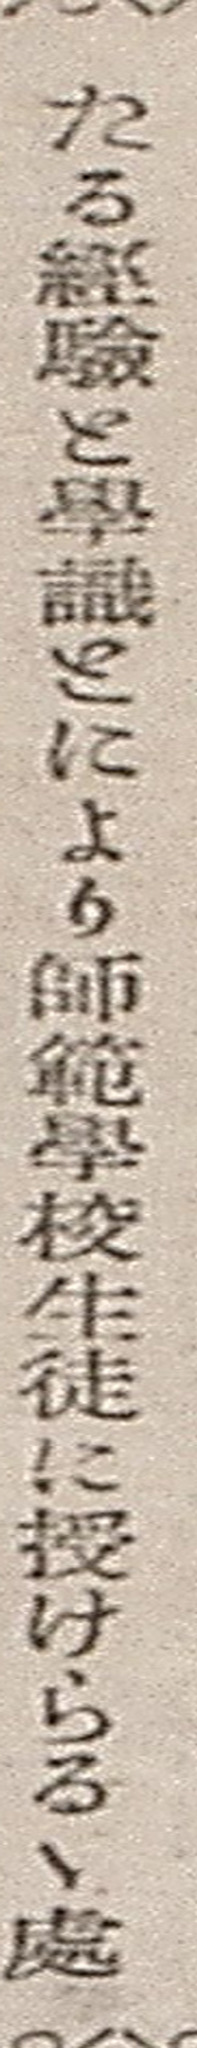たる経験と学識とにより師範学校生徒に授けらるゝ処
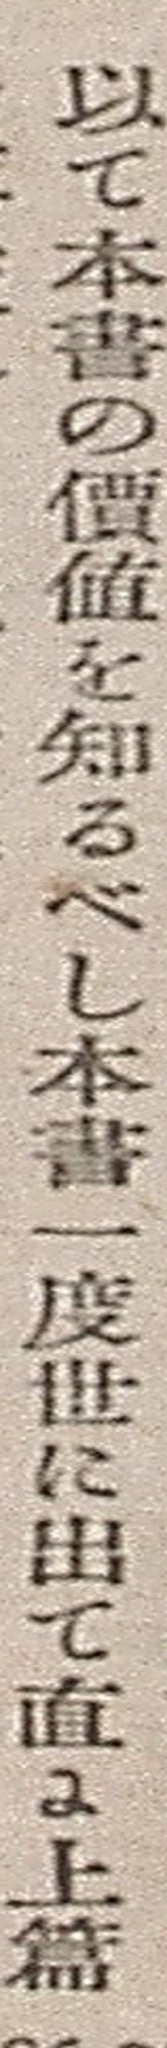以て本書の価値を知るべし本書一度世に出て直に上編
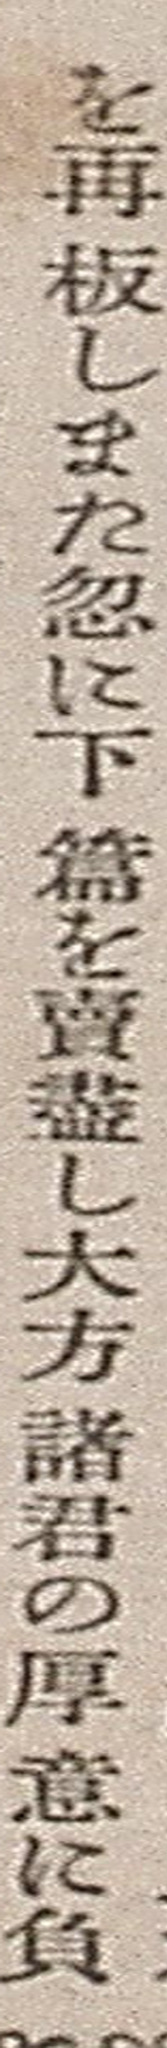を再板しまた忽に下編を売尽し大方諸君の厚意に負
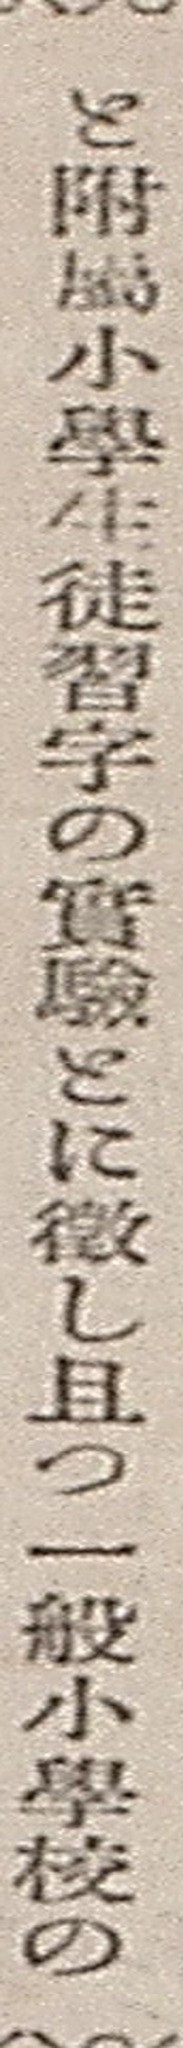と附属小学校生徒習字の実験とに徴し且つ一般小学校の
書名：風俗畫報臨時増刊第百二十四號　洪水地震被害録（上）
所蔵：東京大学地震研究所図書室 Earthquake Research Institute Library, The University of Tokyo, JAPAN
